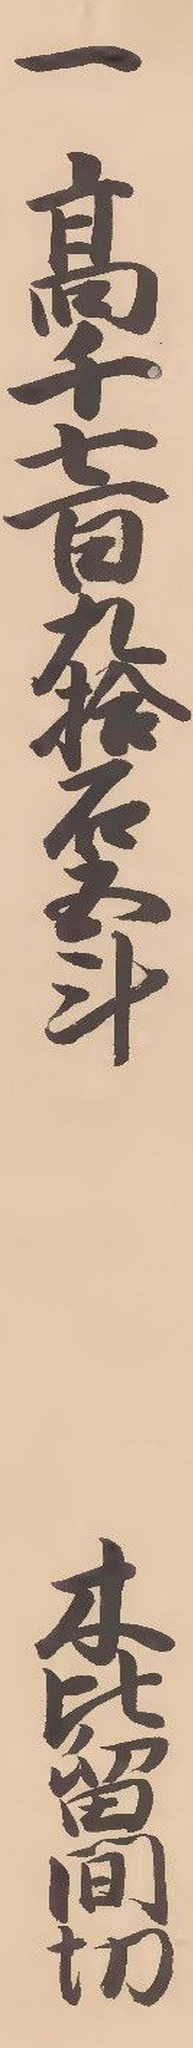一高千七百九拾石五斗木比留間切
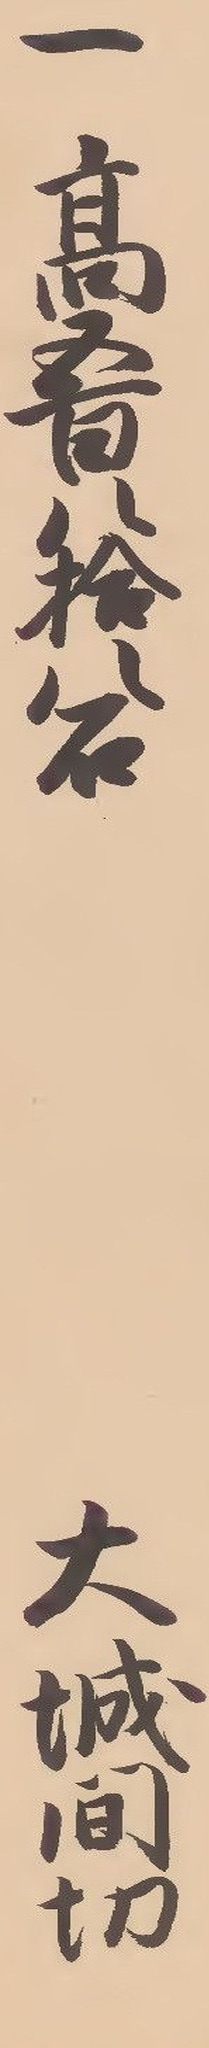一高五百八拾八石大城間切

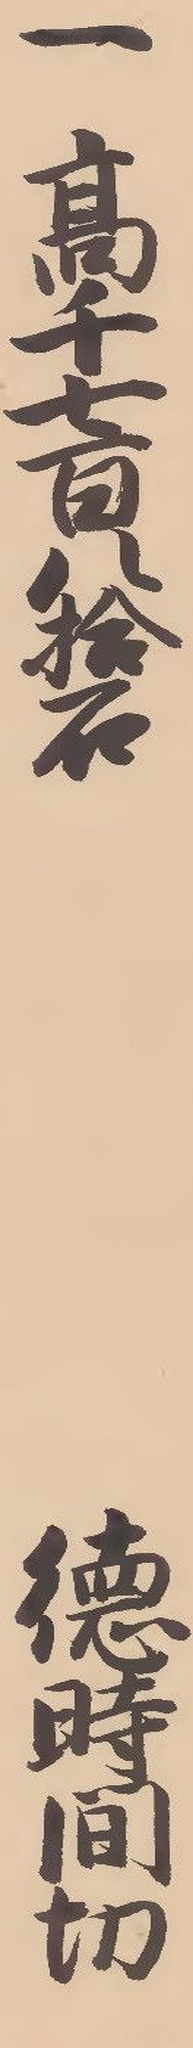一高千七百八拾石徳時間切
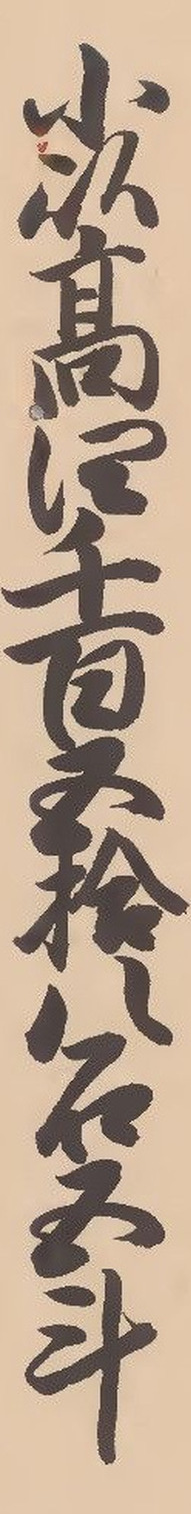小以高四千百五拾八石五斗
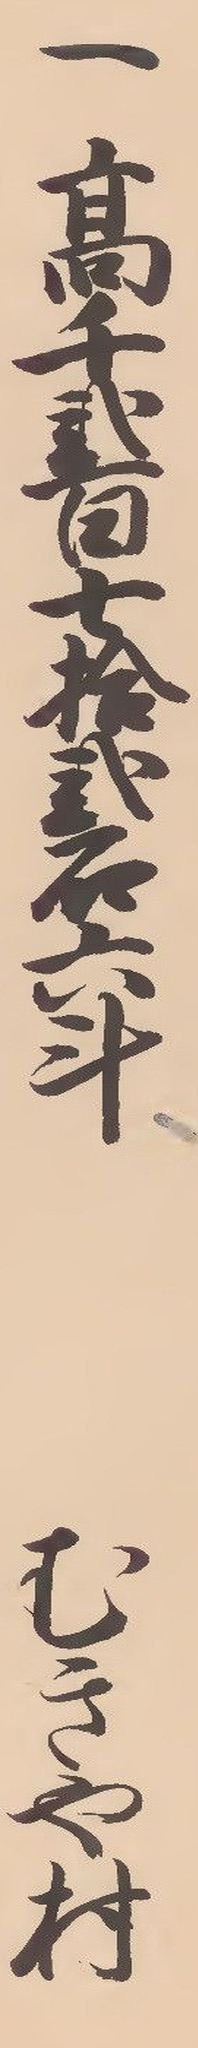一高千弐百七拾弐石六斗むきや村
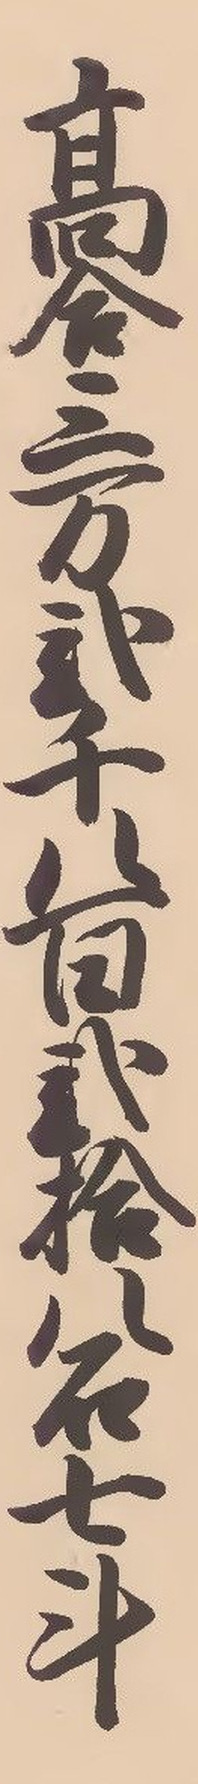高合三万弐千八百弐拾八石七斗
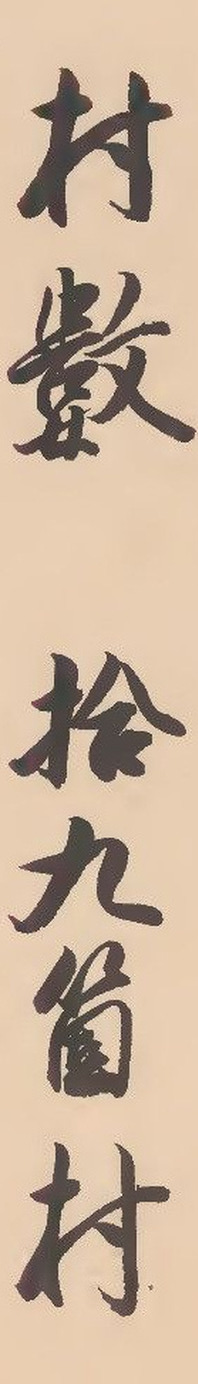村数拾九箇村
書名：琉球国郷帳　中
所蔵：国立公文書館 National Archives of Japan
